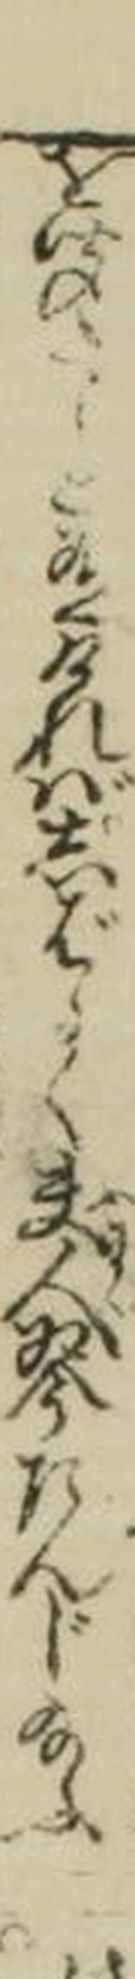を聞たしと有ければ。しばらく夫人琴たんじ給ふ
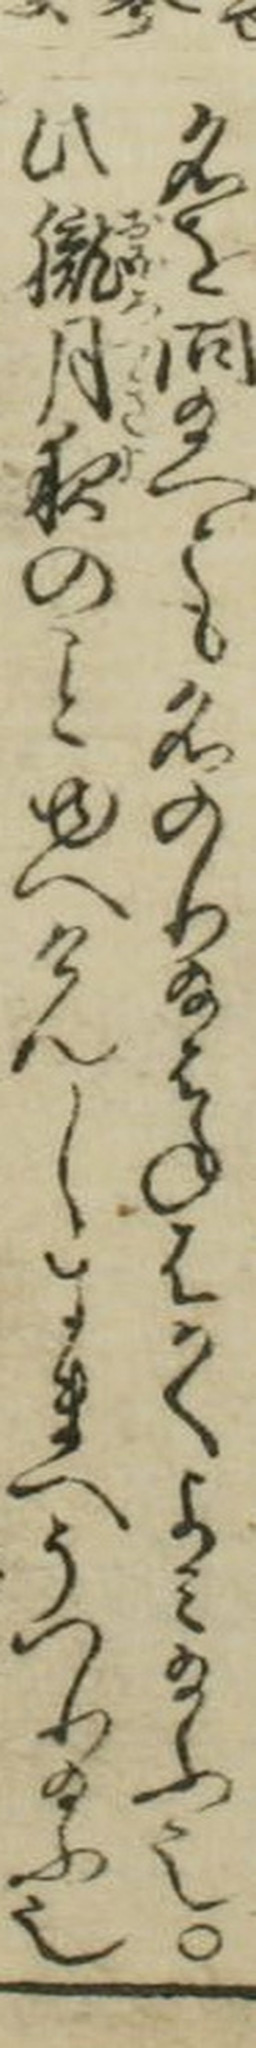此朧月夜のことゆへけんしすまへうつり給ふ也。
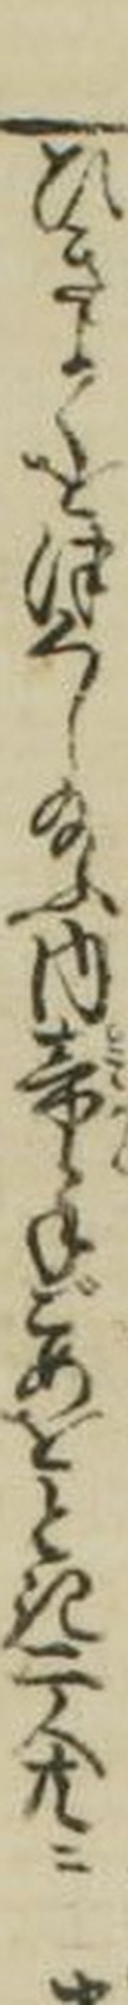ひきよくをつくし給ふ内。帝手ごめをとき二人共に
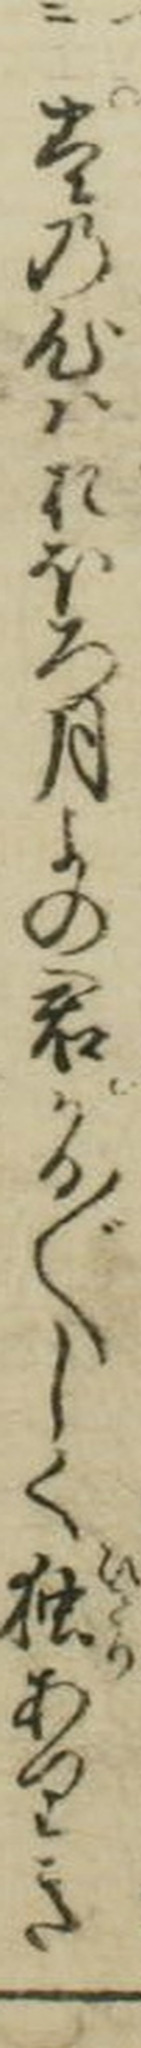巻の心はおほろ月よの君。かる〴〵しく独ありき
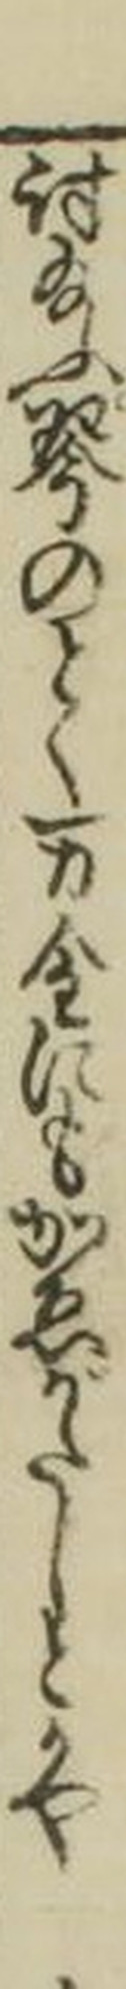討給ふ。琴のとく万金にもかゑがたしとかや
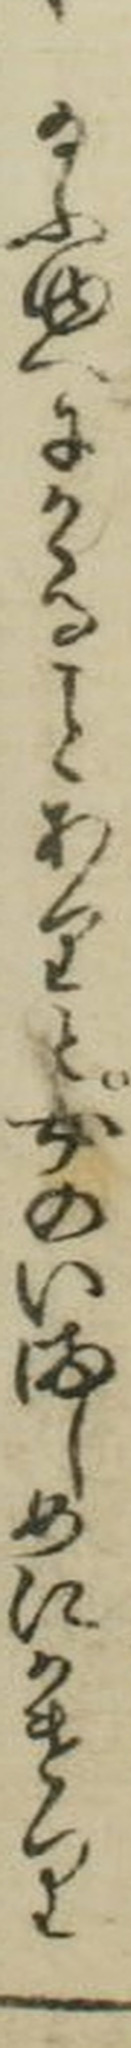給ふゆへにかゝることありと。女のいましめにかけり
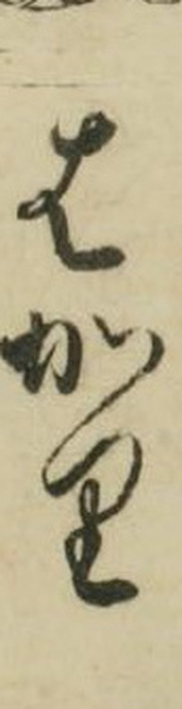はかり
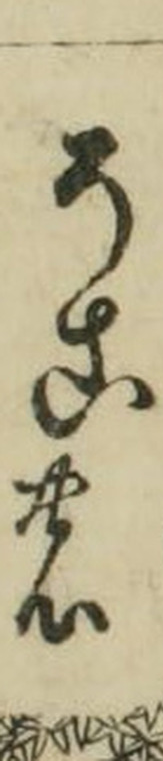そこの
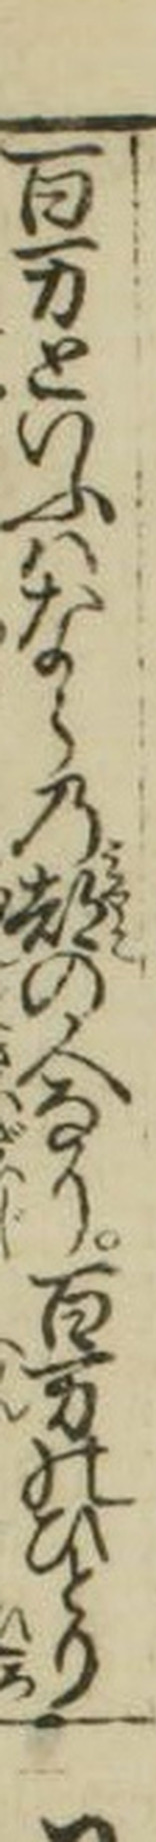百万といふはならの都の人なり。百万のひとり
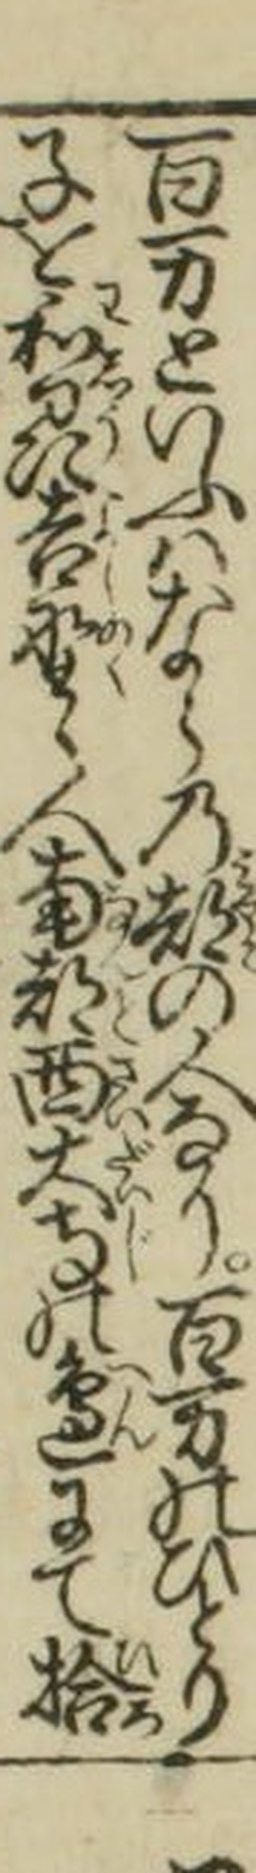子を和州吉野ゝ人南都西大寺の辺にて拾
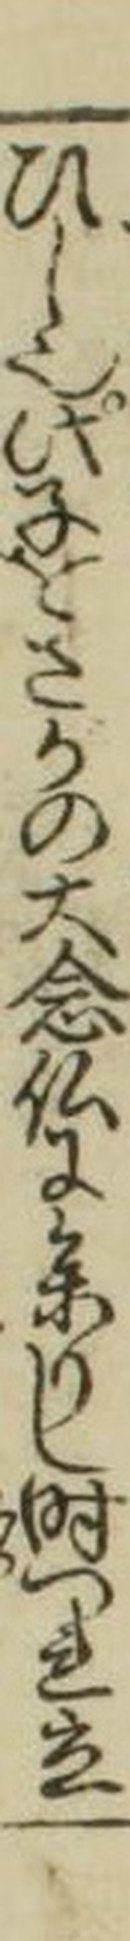ひし也。此子をさかの大念仏に参りし時つれ立
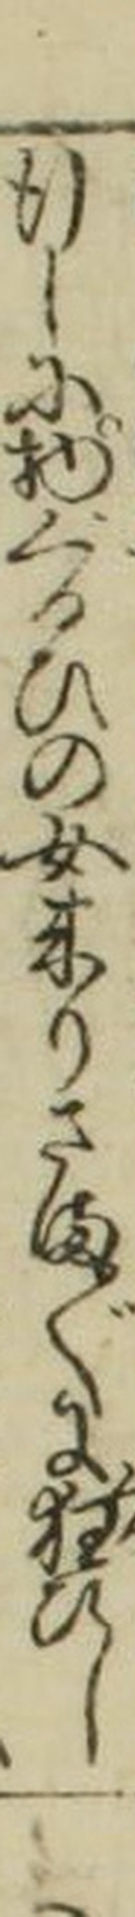行しに。物くるひの女来りさま〴〵に狂ひし
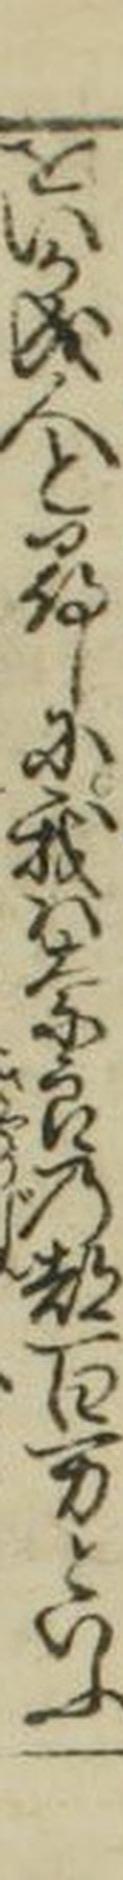をいか成人と尋しに。我は奈良の都百万といふ
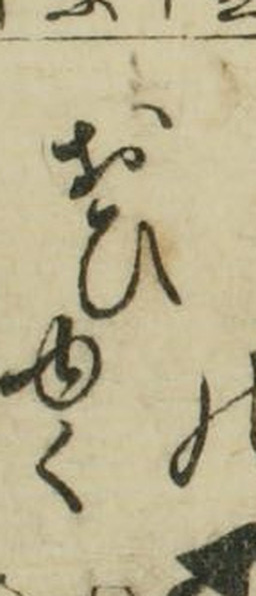おひゆく
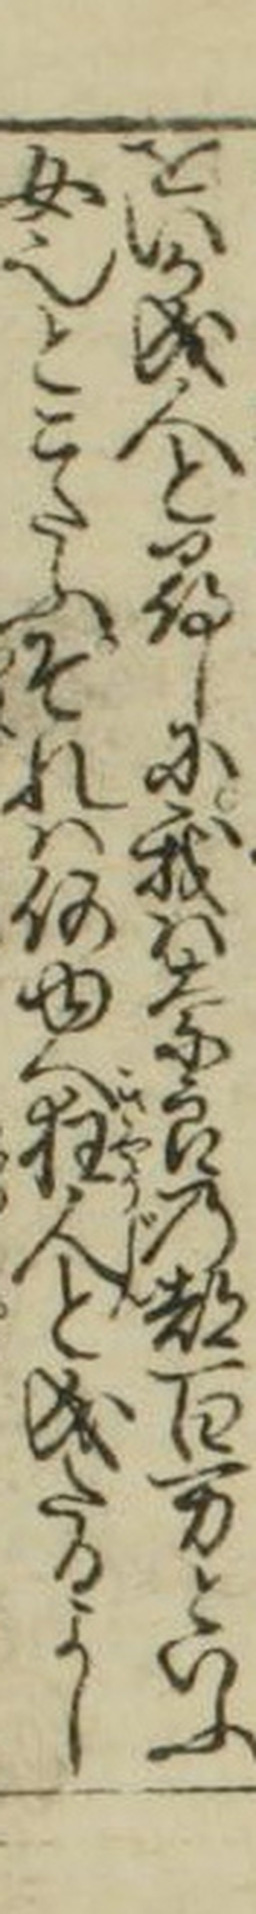女也とこたふ。それは何ゆへ狂人と成たるよし
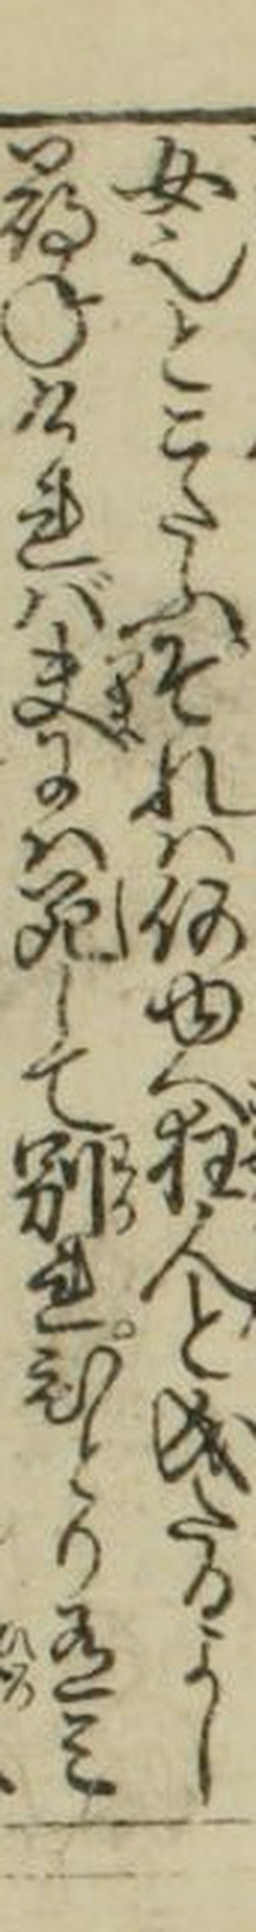尋ねければ夫には死して別れ。ひとり有み
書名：女源氏教訓鑑
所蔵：東京学芸大学附属図書館
